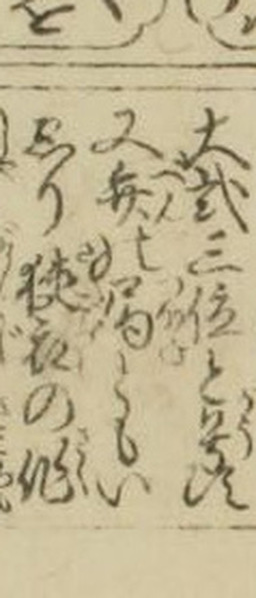又弁の局ともい
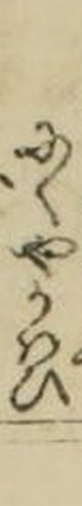にくやかはひ
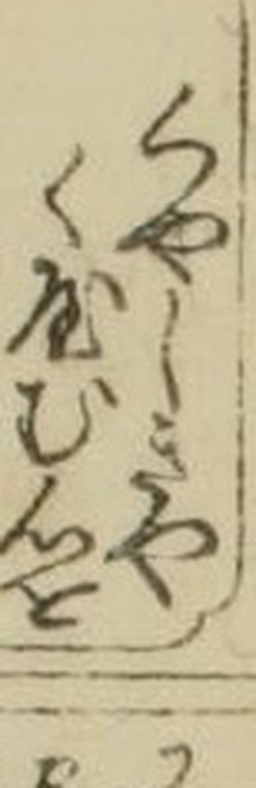くやむ心を
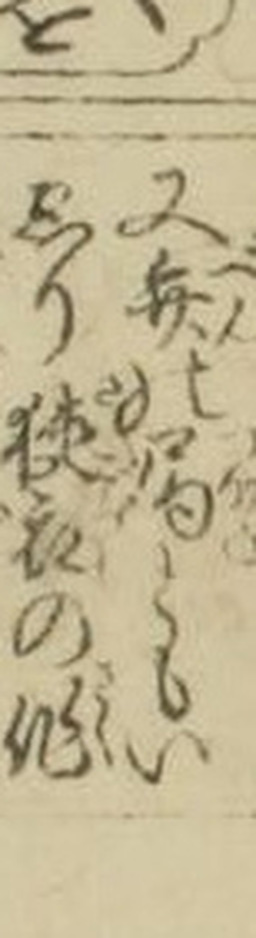ゑり狭衣の作
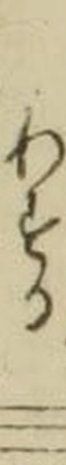わする
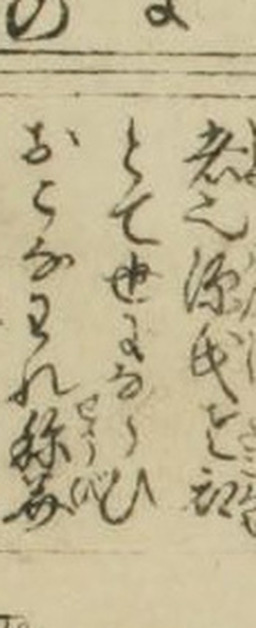とて世にならひ
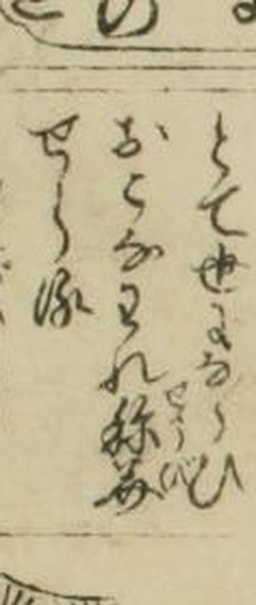おこなわれ称美
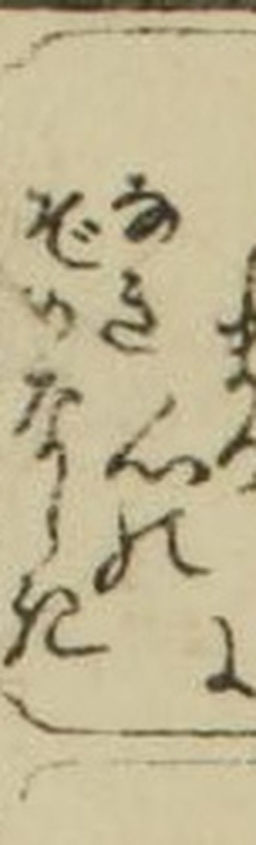ぞかなしき
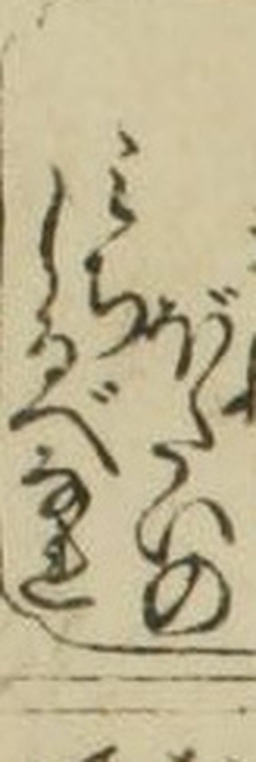しるべなれ
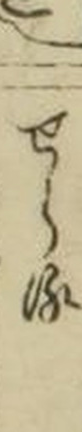せらる
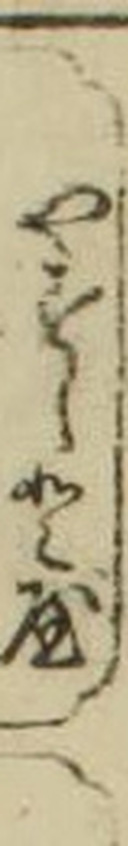やすしとや
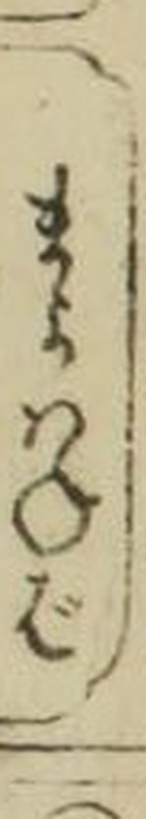まよはねば
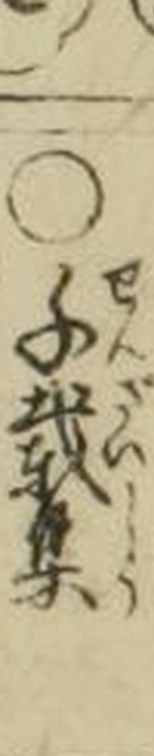◯千載集
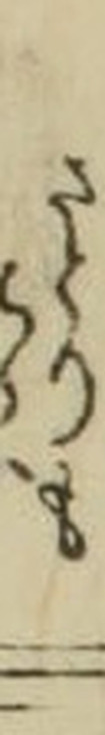さとりも
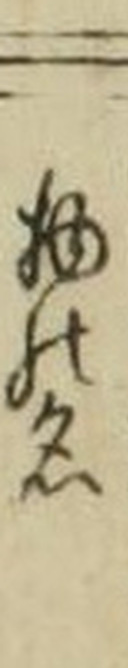物の名
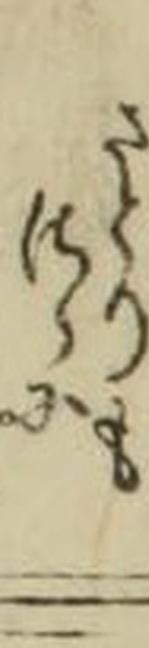さらに
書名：女源氏教訓鑑
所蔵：東京学芸大学附属図書館
